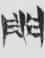澗
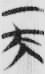一夫
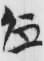凥
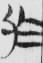於
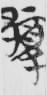○（复）
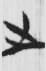之
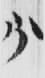少
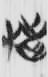桃
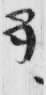邑
